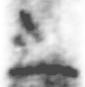之
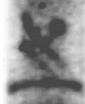之
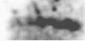一
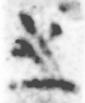之
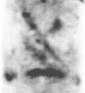之
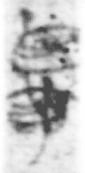○（緅）
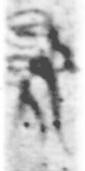敗
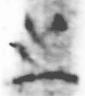之
